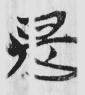是
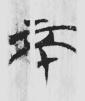不
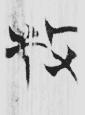攼
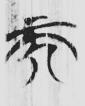而
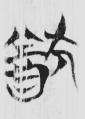猶
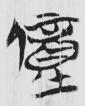僮
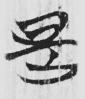是
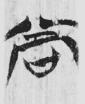尚
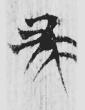求
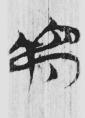弔
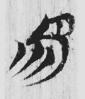易
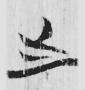之
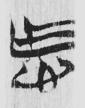怍
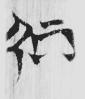凥
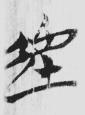𫊟
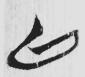㠯（以）
